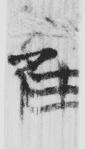隹
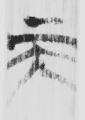天
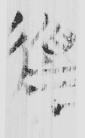道
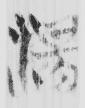湯
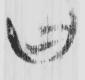曰
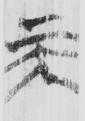天
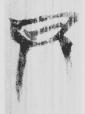尹
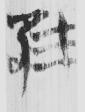唯
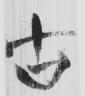古
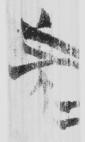先=
